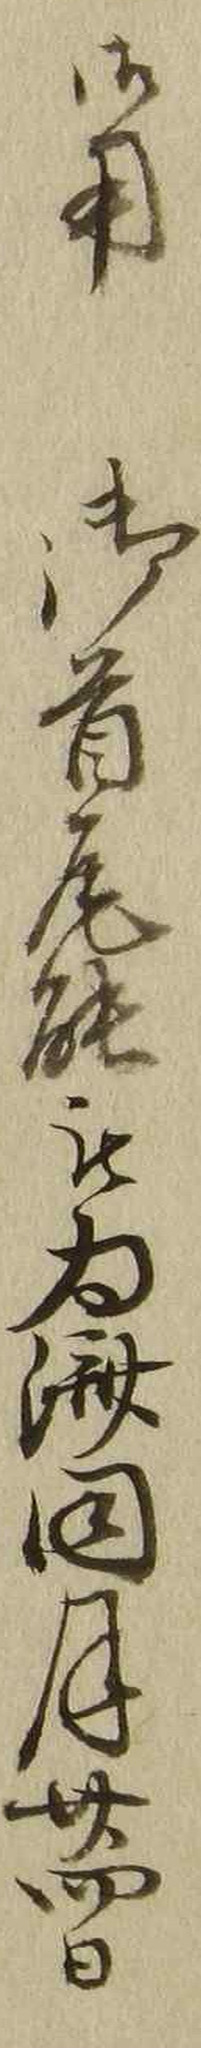御用御首尾能被為済同月廿四日
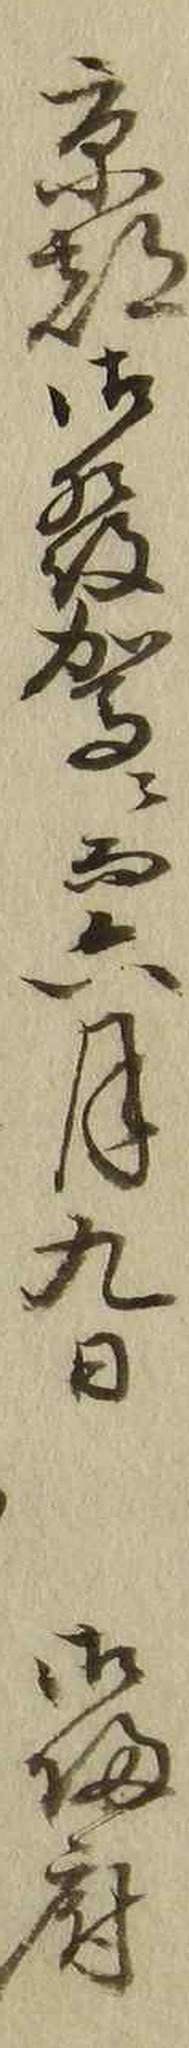京都御発駕ニ而六月九日御帰府
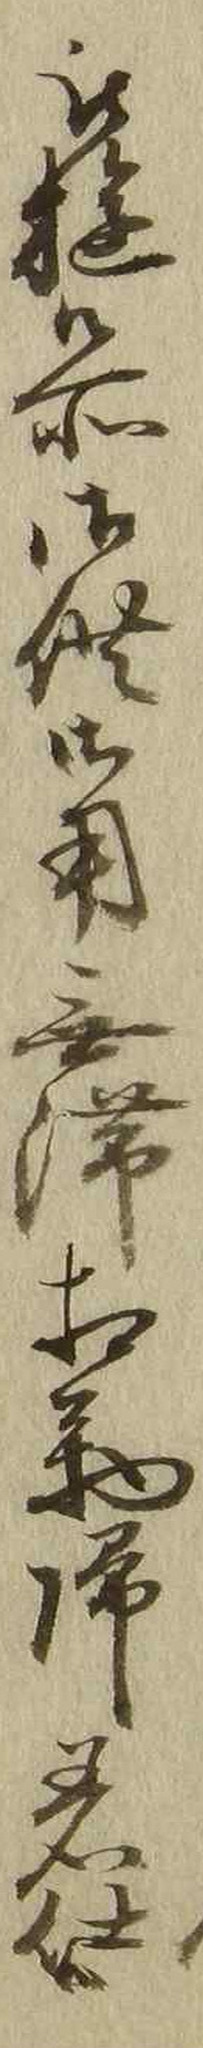被遊候所御供御用無滞相勤帰着仕候
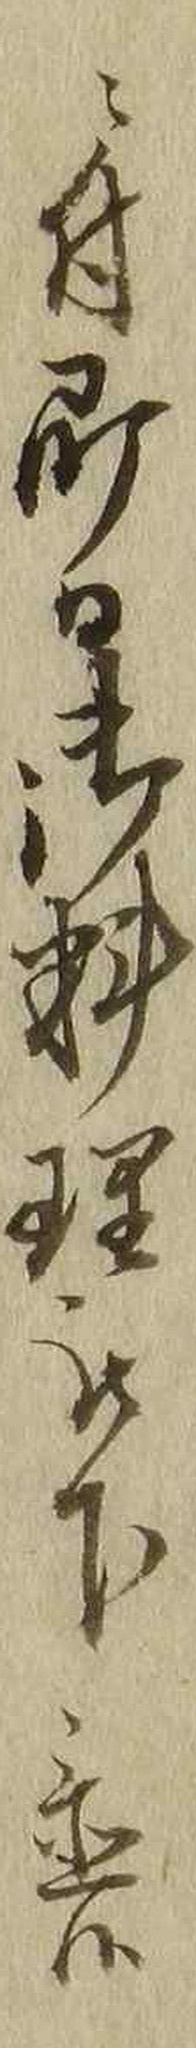ニ付即日御料理被下置候
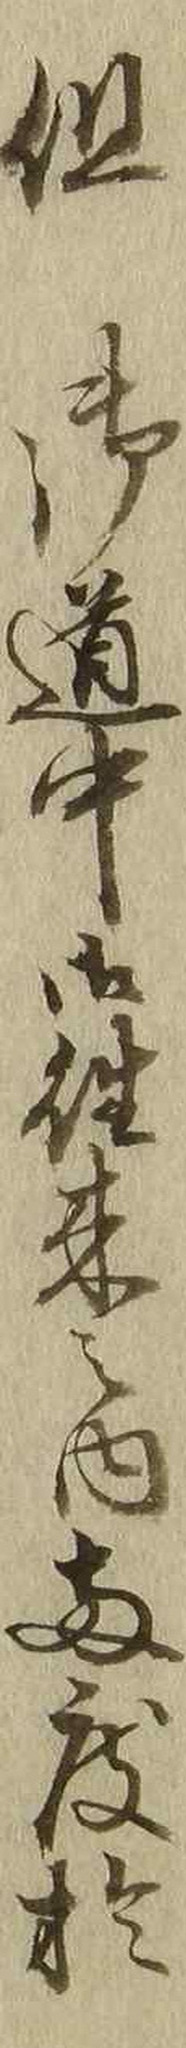但御道中御往来之内両度於
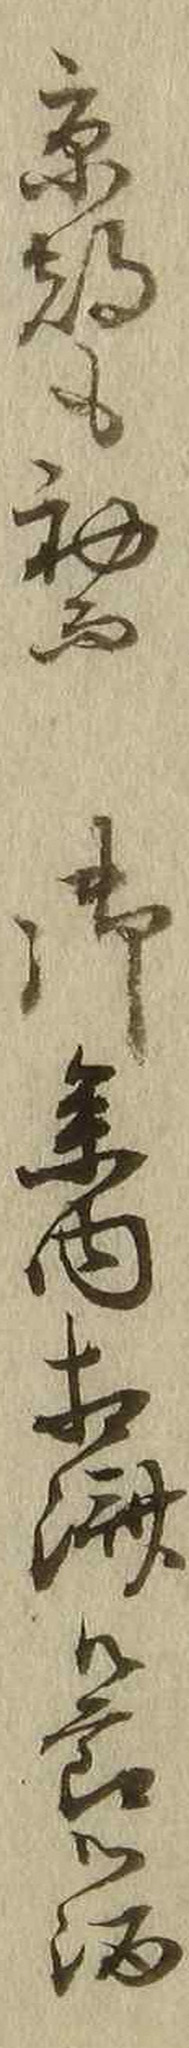京都も初而御参内相済候節御酒
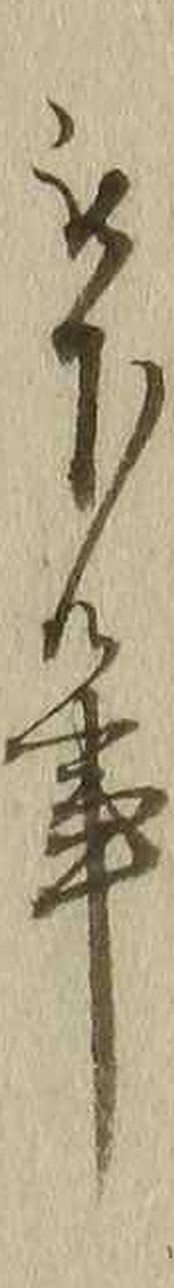被下候事
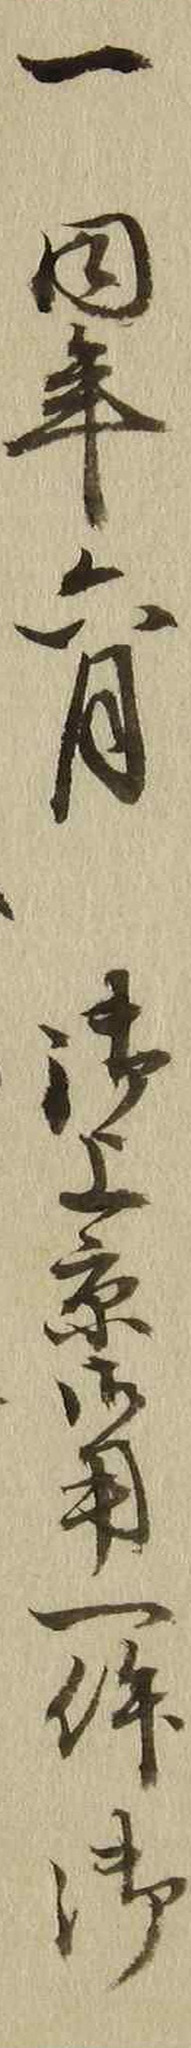一同年六月御上京御用一件御
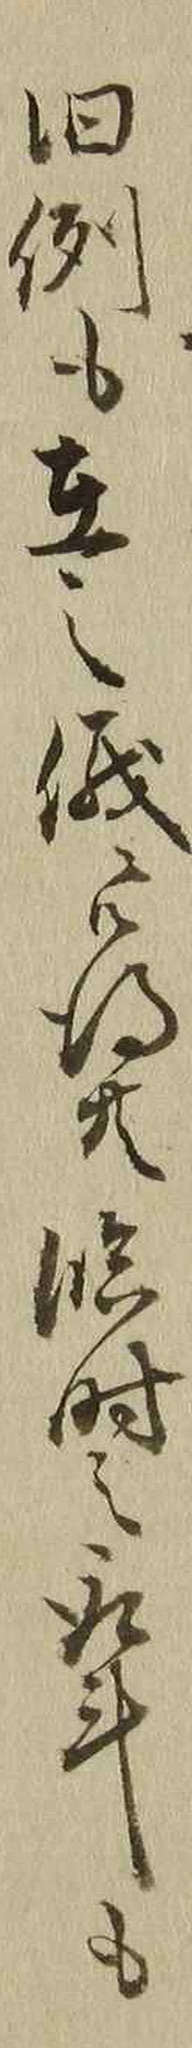旧例も在之儀ニ候得共臨時之取斗も
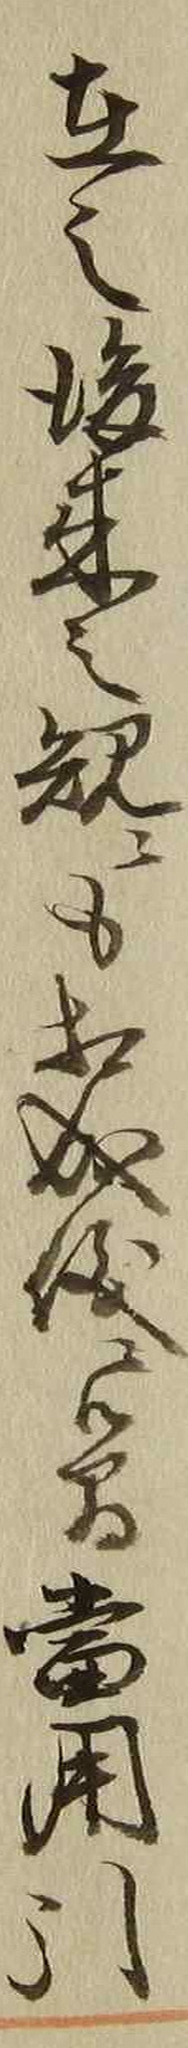在之後来之規ニも相成儀ニ候間当用引
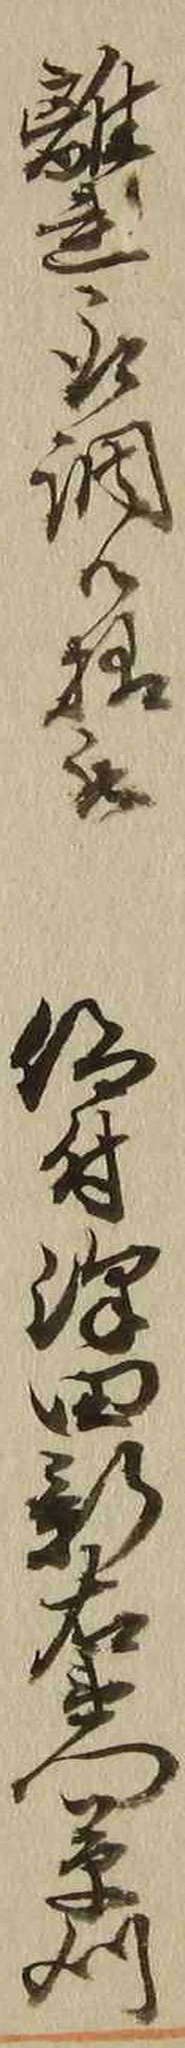離れ取調候様被仰付深田新右衛門草刈
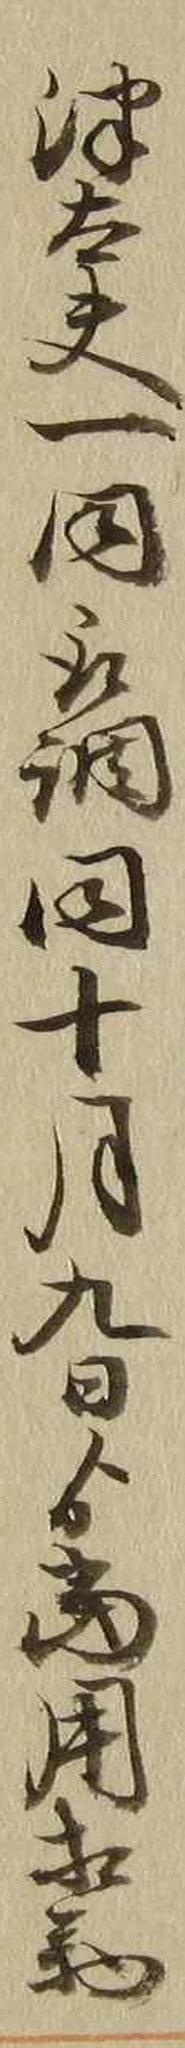津太夫一同取調同十月九日ゟ当用相勤
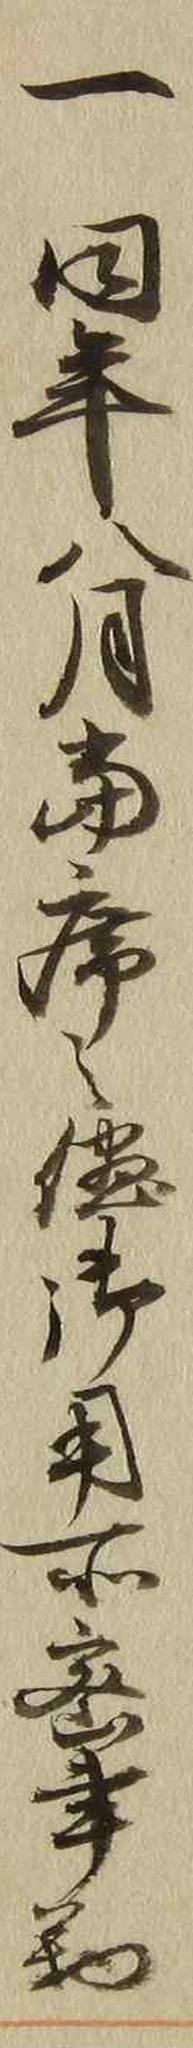一同年八月当席之儘御用所密事勤
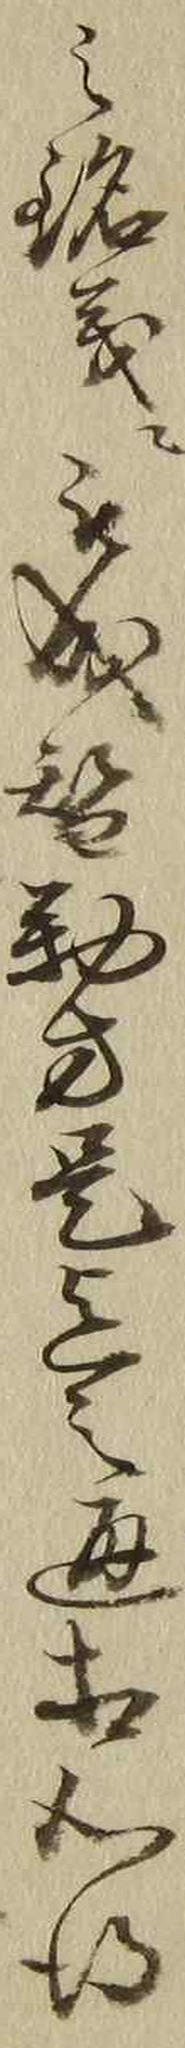之銘義ニ被成替勤方是迄之通相心得
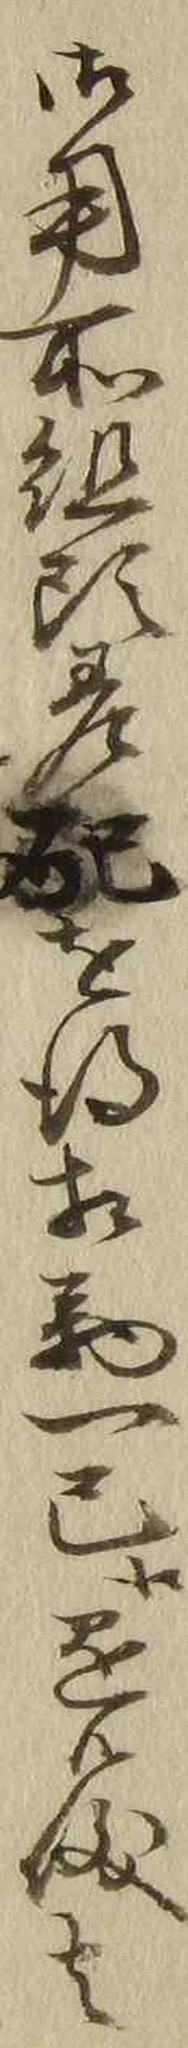御用所組頭差配を得相勤一己江懸候儀者
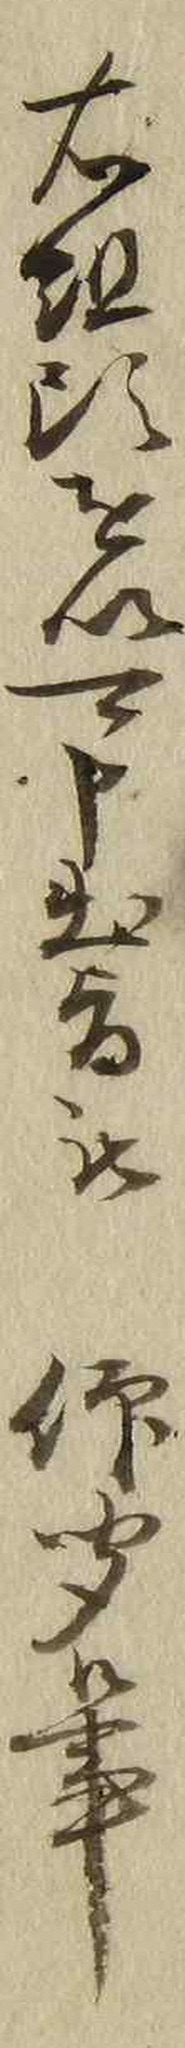右組頭を以可申出旨被仰聞候事
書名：諸士系譜　巻之64　と之部7
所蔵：会津若松市立会津図書館
